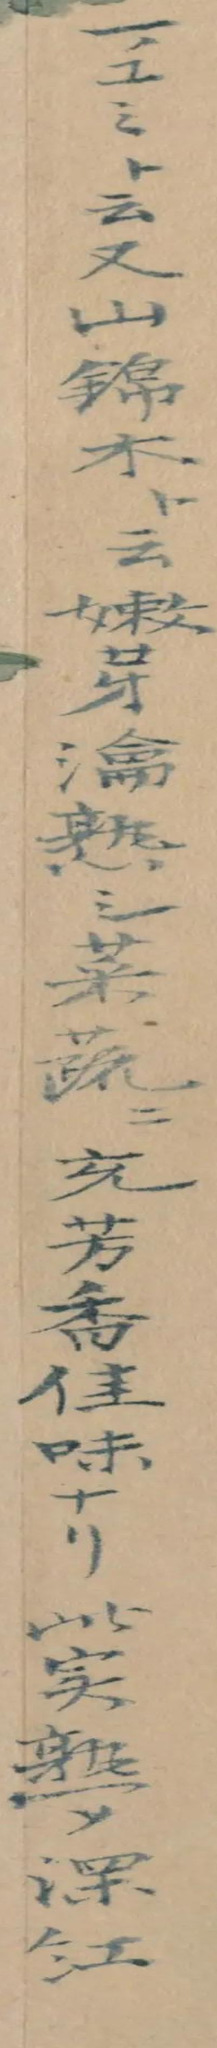マユミト云又錦木ト云嫩芽熟シ菜蔬ニ充芳香佳味ナリ此実熟シテ深紅
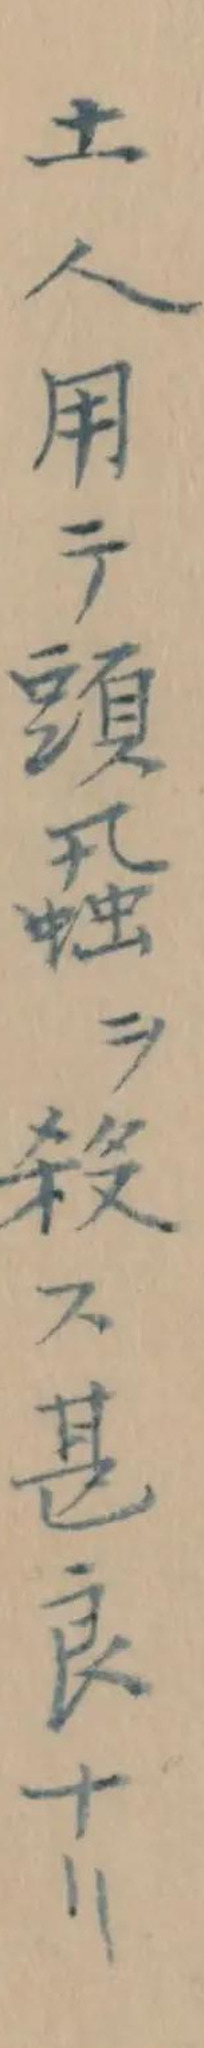土人用テ頭蝨ヲ殺ス甚良ナリ
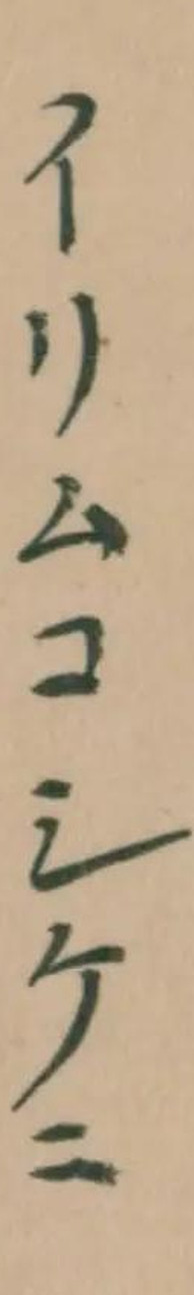イリムコシケニ
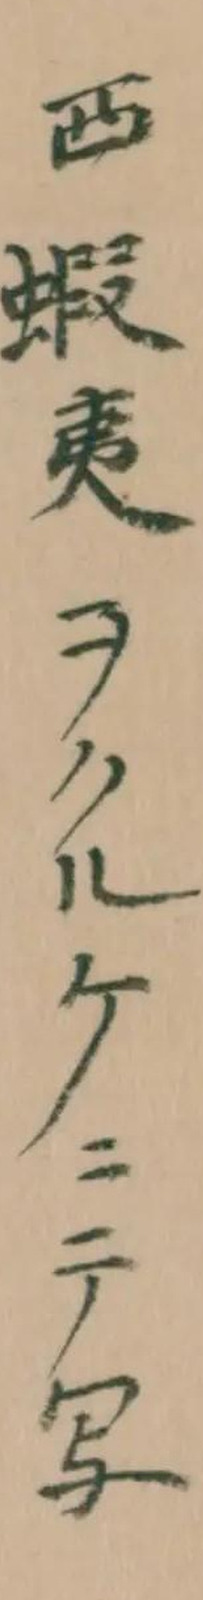西蝦夷ヲクルケニテ写
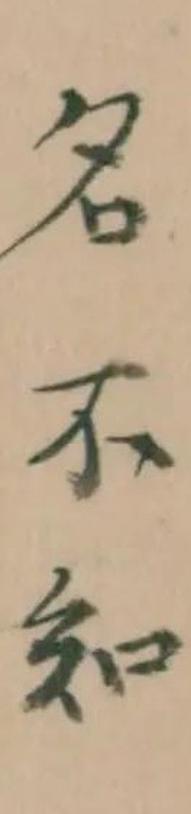名不知
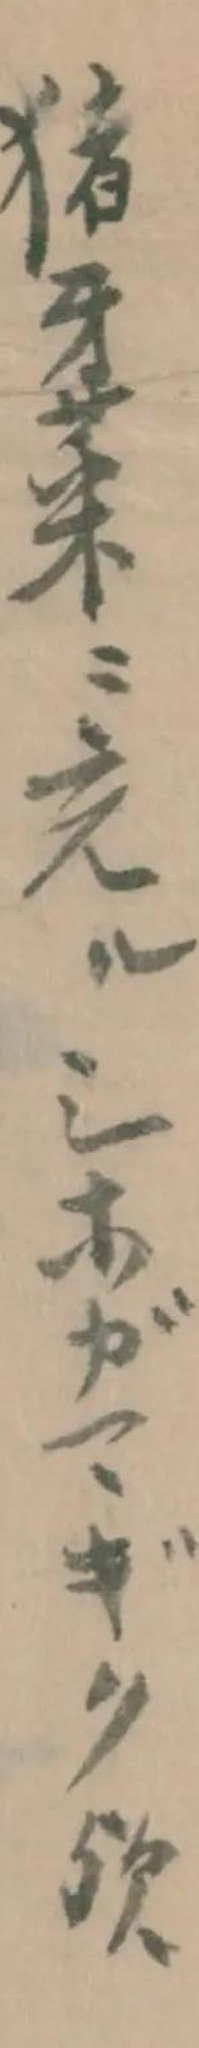猪牙菜ニ充ルシホガマキク歟
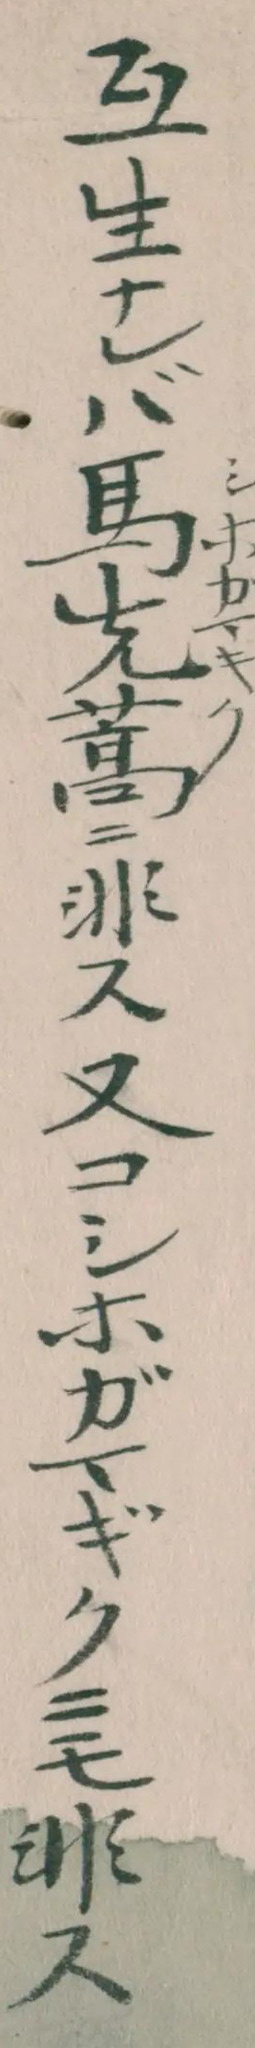互生ナレバ馬先蒿ニ非ス又コシホガマギクニモ非ス

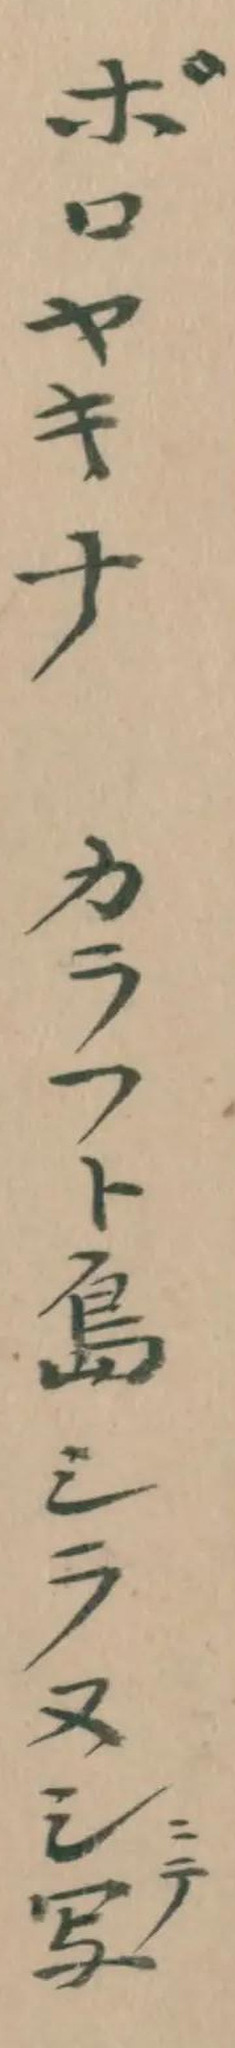ポロヤキナカラフト島シラヌシニテ写
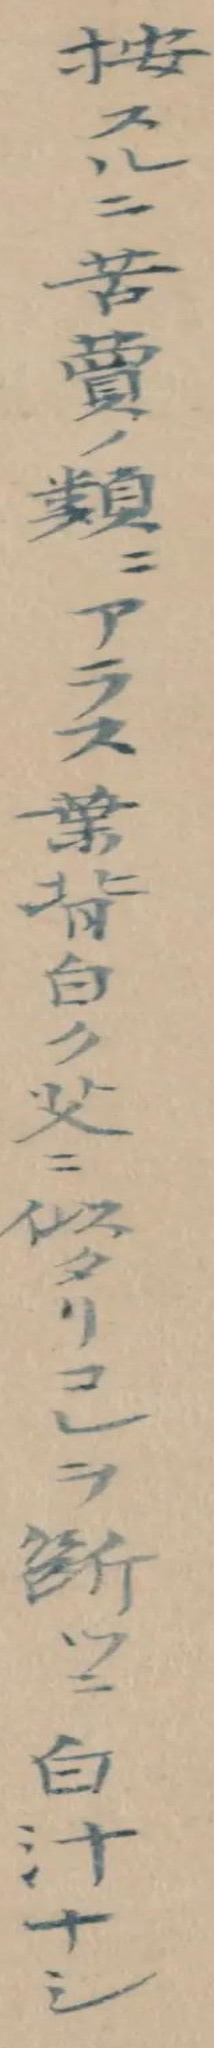按スルニ苦蕒ノ類ニアラス葉背白ク艾ニ似タリコレヲ断ツニ白汁ナシ
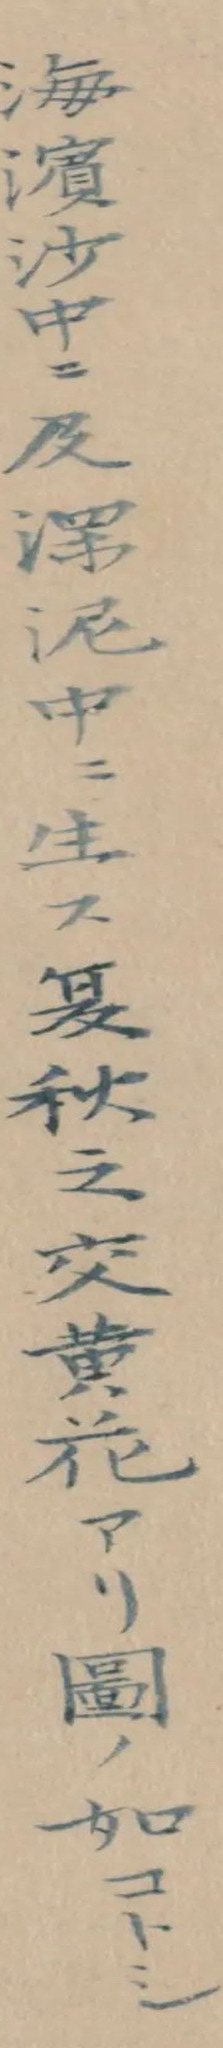海浜沙中ニ及深泥中ニ生ス复秋之交黄花アリ図ノ如コトシ
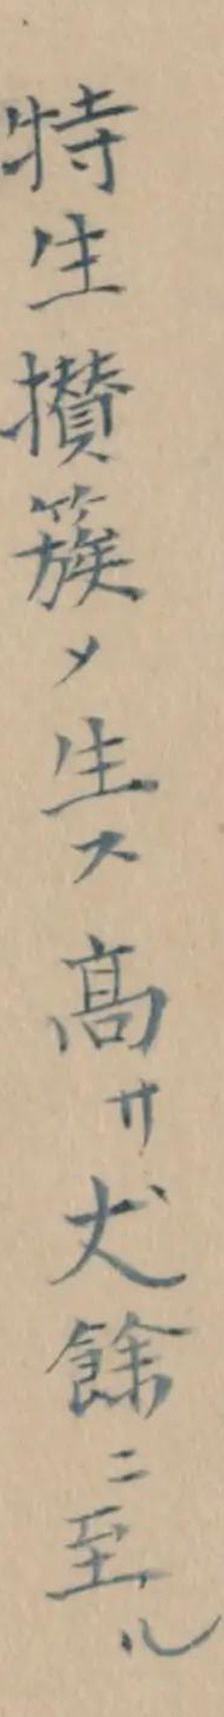特生攅簇シテ生ス高サ犬余ニ至ル
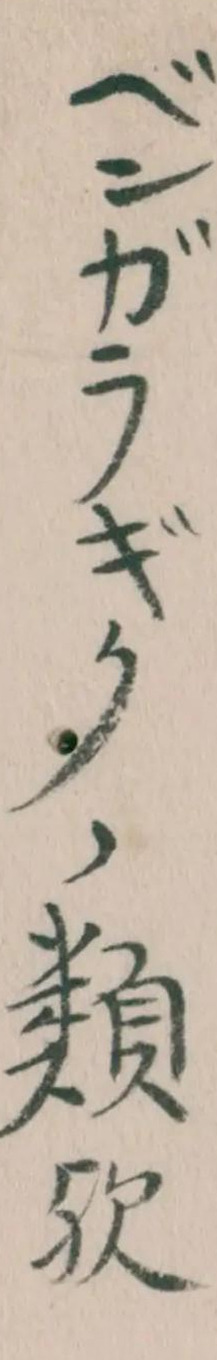ベンガラギクノ類歟

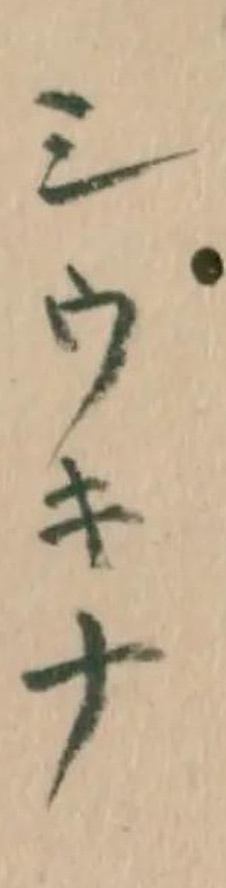シウキナ
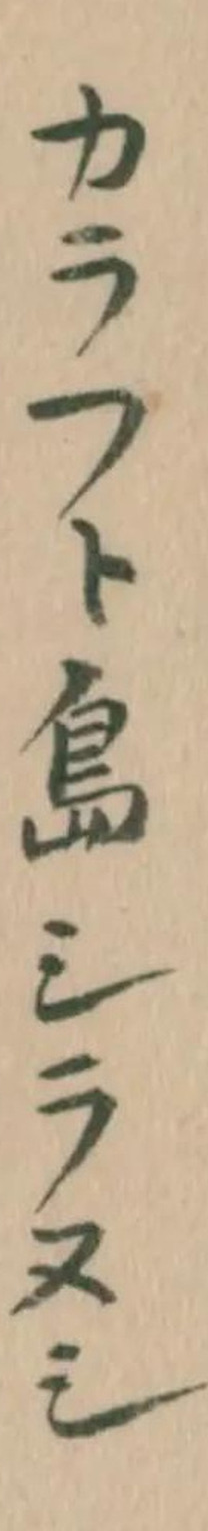カラフト島シラヌシ
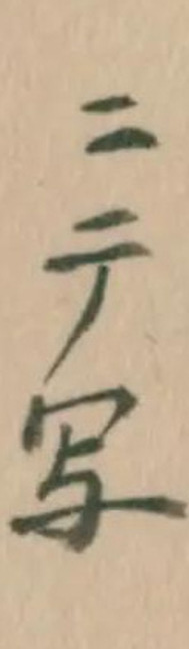ニテ写
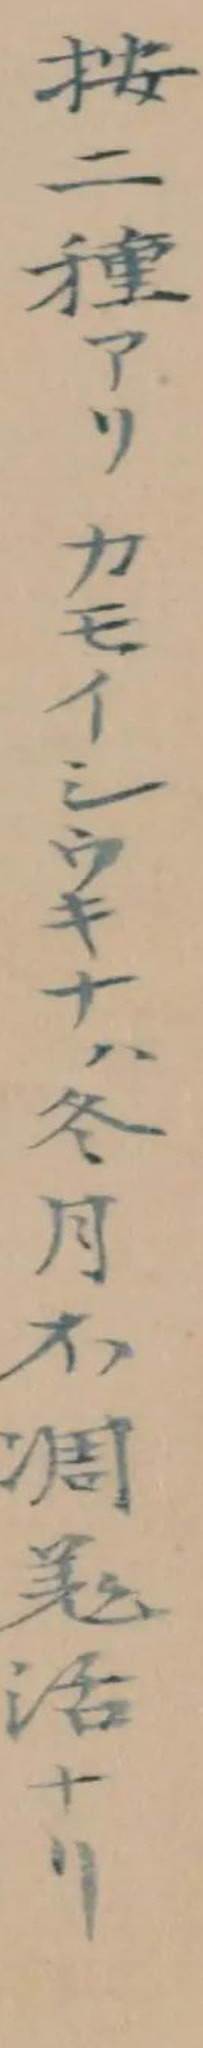按二種アリカモイシウキナハ冬月不凋美？活ナリ
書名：蝦夷草木図
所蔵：国立国会図書館 National Diet Library, JAPAN
